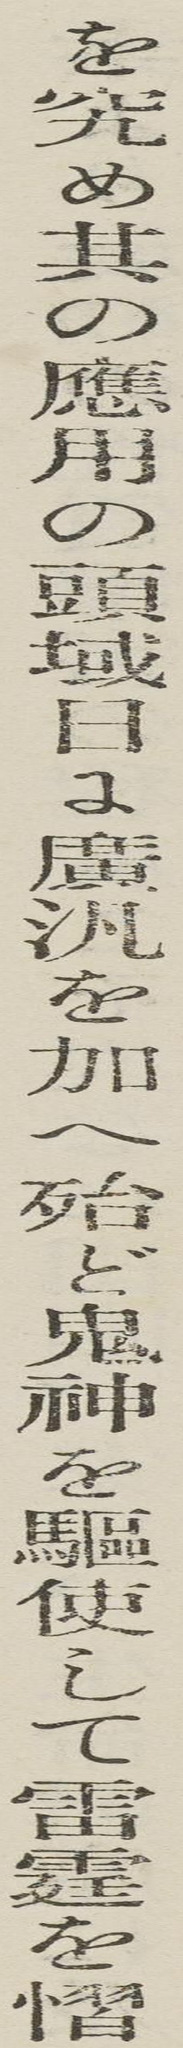を究め其の応用の頭域日に広汎を加へ殆ど鬼神を駆使して雷霆を慴
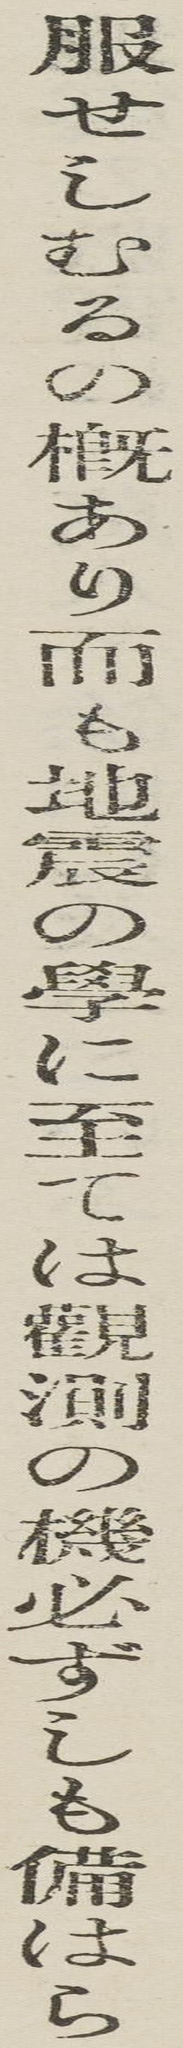服せしむるの概あり而も地震の学に至ては観測の機必ずしも備はら
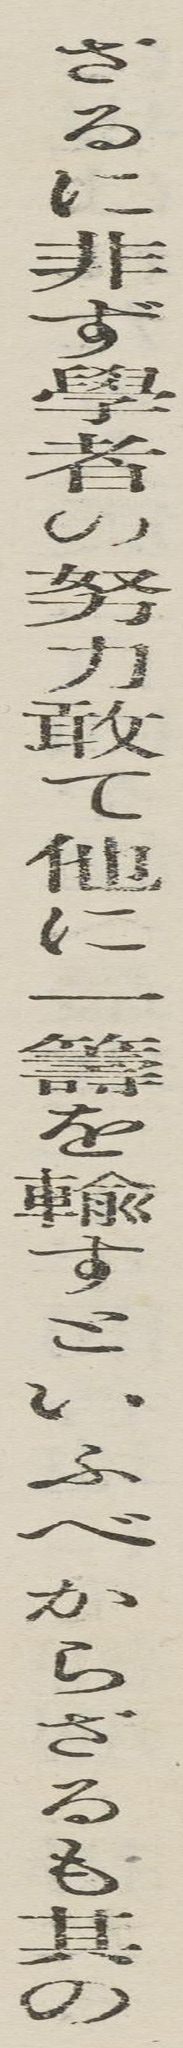ざるに非ず学者の努力敢て他に一籌を輸すといふべからざるも其の
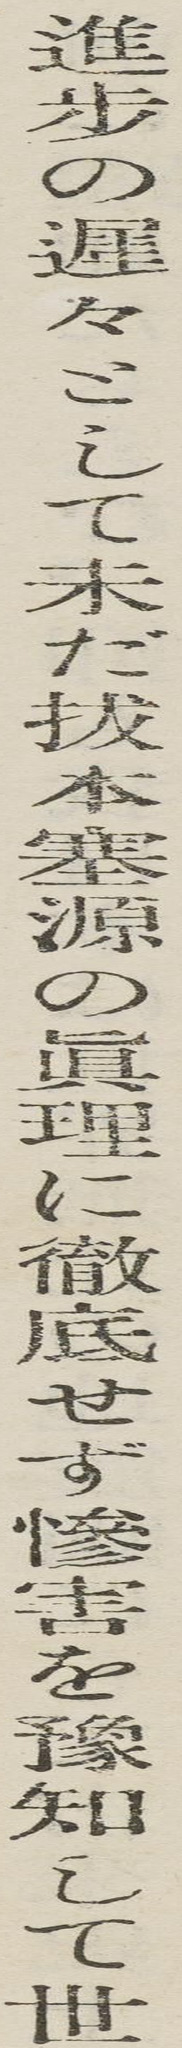進歩の遅々として未だ抜本塞源の真理に徹底せず惨害を予知して世
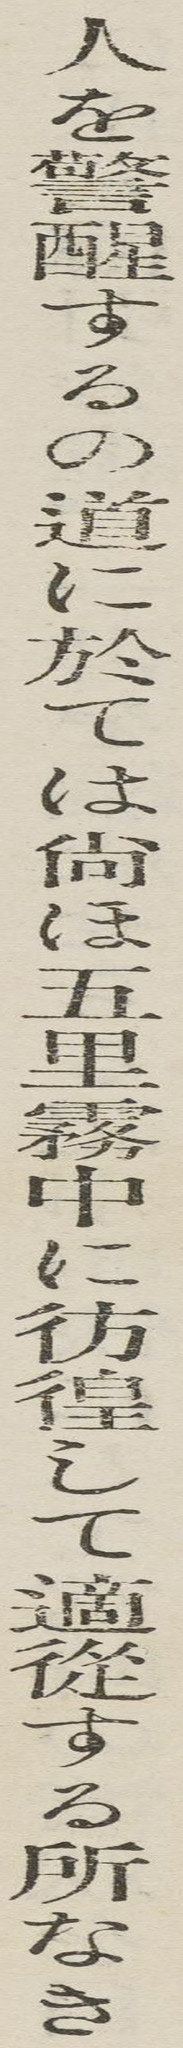人を警醒するの道に於ては尚ほ五里霧中に彷徨して適従する所なき
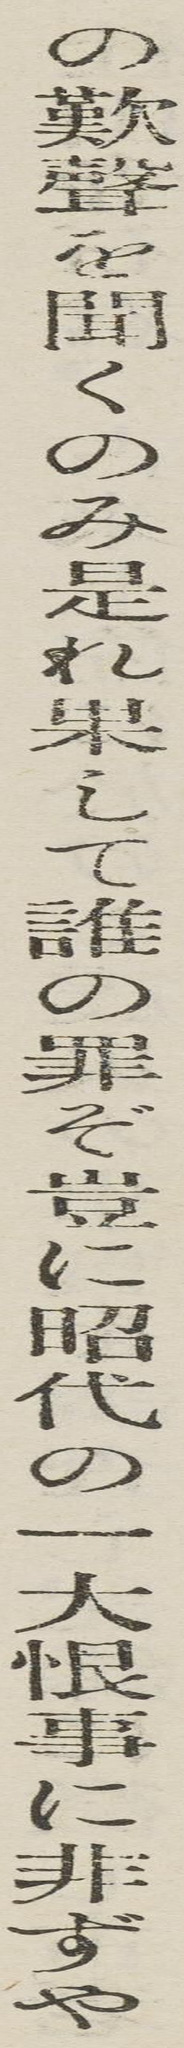の歎声を聞くのみ是れ果して誰の罪ぞ豈に昭代の一大恨事に非ずや
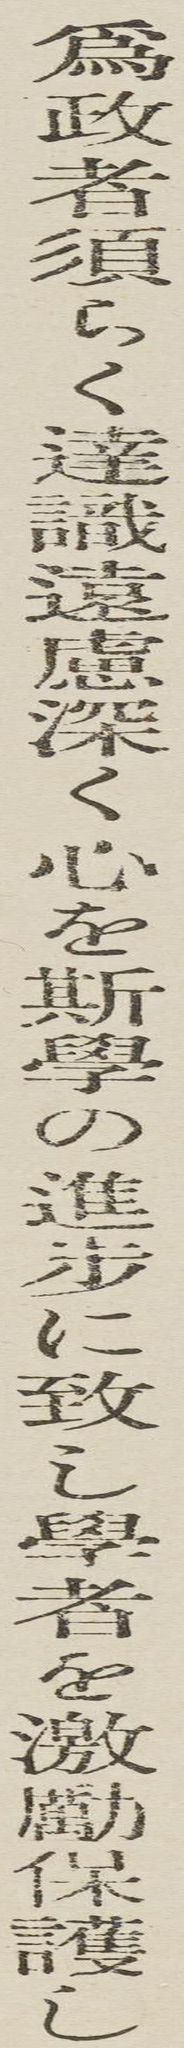為政者須らく達識遠慮深く心を斯学の進歩に致し学者を激励保護し
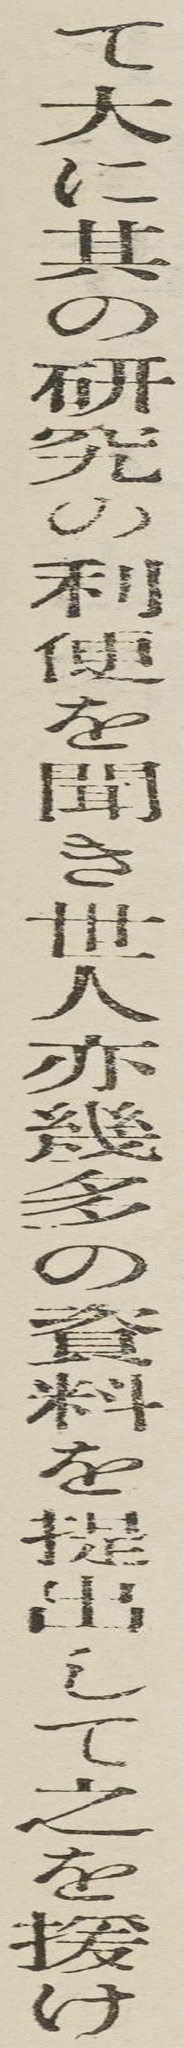て大に其の研究の利便を聞き世人亦幾多の資料を提出して之を援け
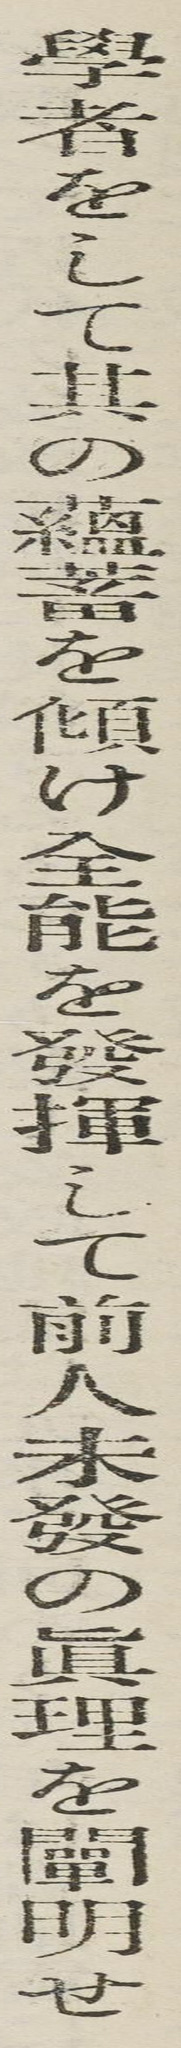学者をして其の蘊蓄を傾け全能を発揮して前人未発の真理を闡明せ
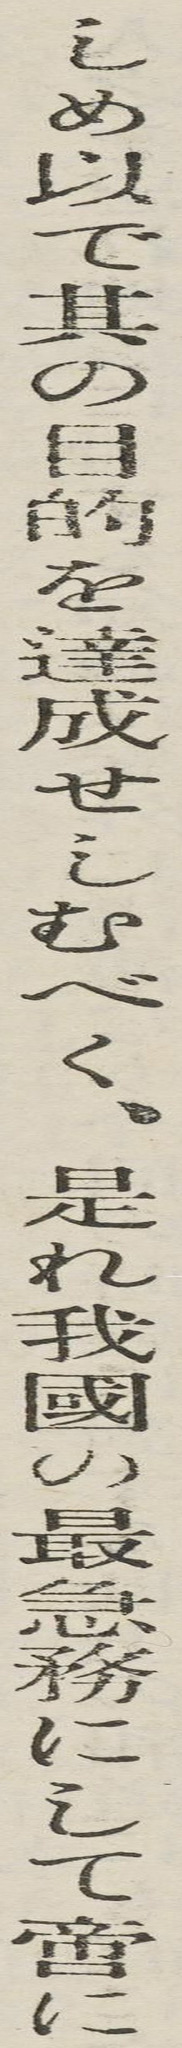しめ以で其の目的を達成せしむべく、是れ我国の最急務にして啻に
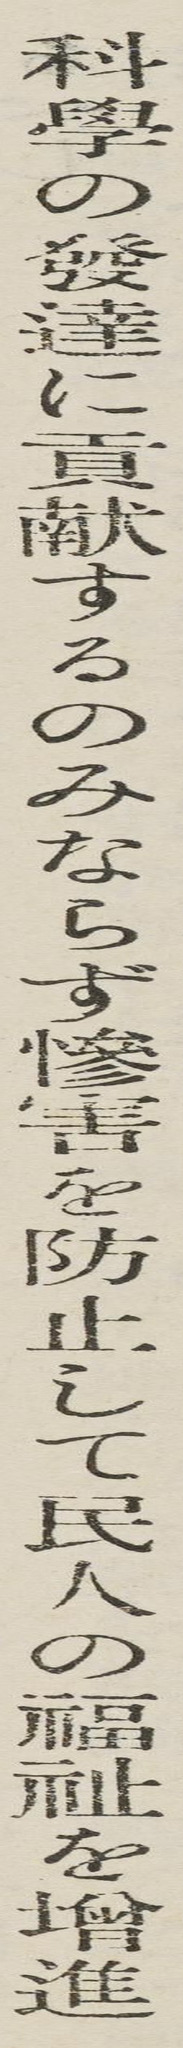科学の発達に貢献するのみならず惨害を防止して民人の福祉を増進
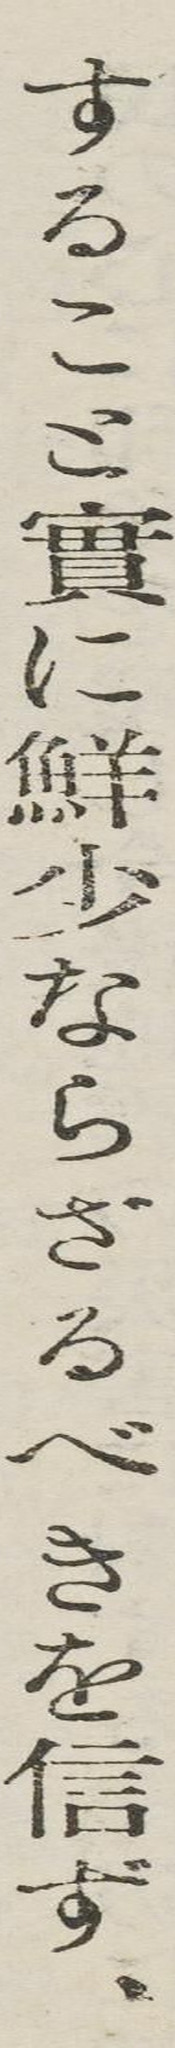すること実に鮮少ならざるべきを信ず、
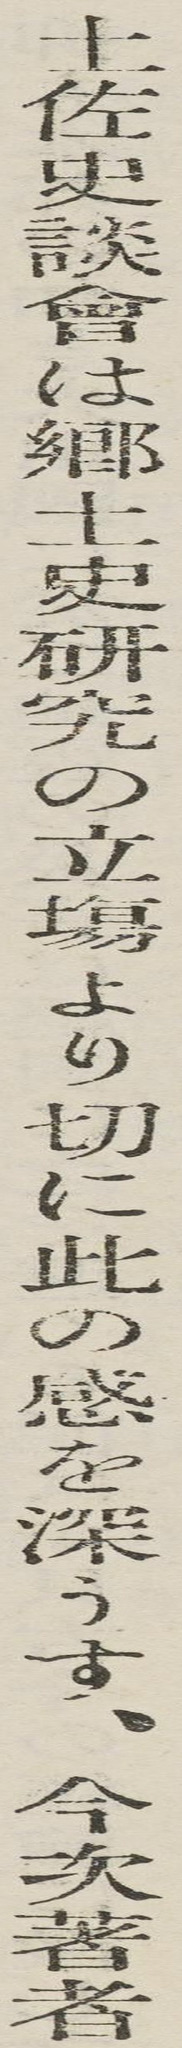土佐史談会は郷土史研究の立場より切に此の感を深うす、今次著者
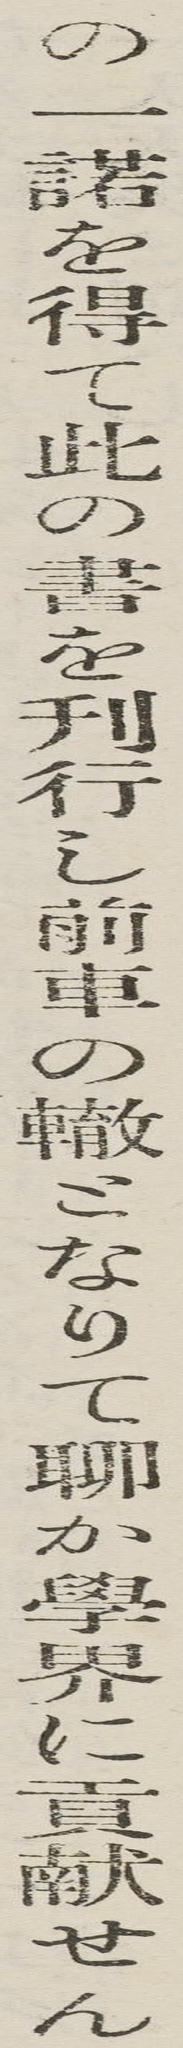の一諾を得て此の書を刊行し前車の轍となりて聊か学界に貢献せん
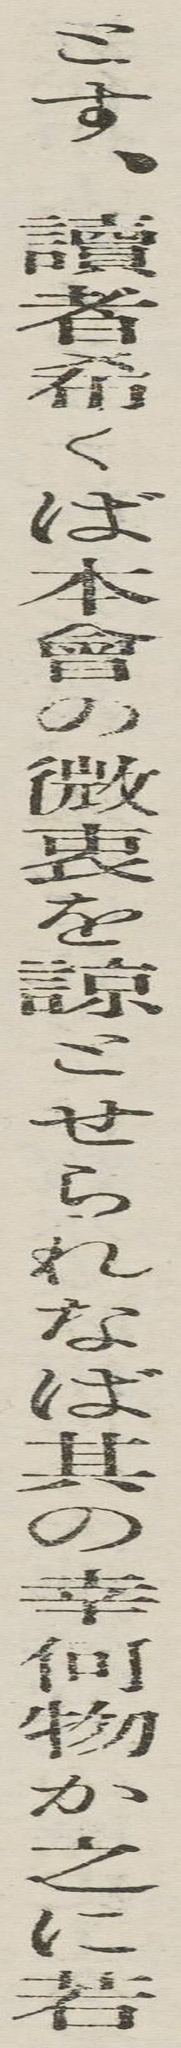とす、読者希くば本会の微吏を諒とせられなば其の幸何物か之に若
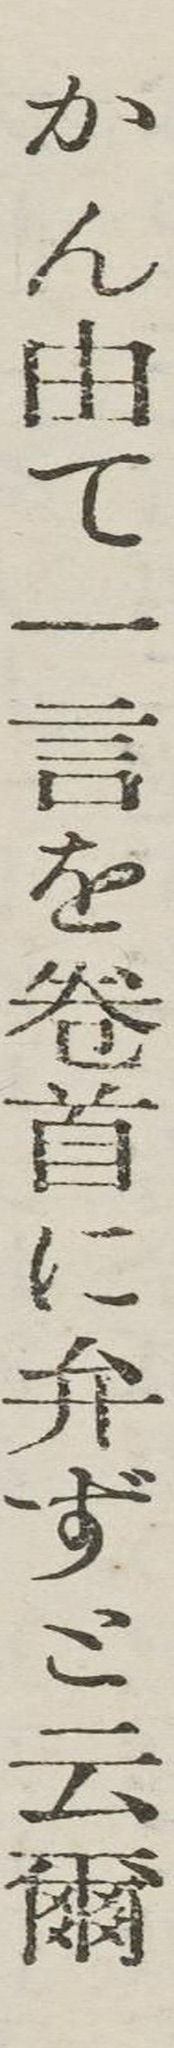かん由て一言を巻首に弁ずと云爾
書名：土佐古今ノ地震
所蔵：東京大学地震研究所図書室 Earthquake Research Institute Library, The University of Tokyo, JAPAN
